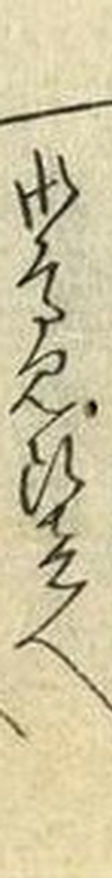御鳥見頭壱人
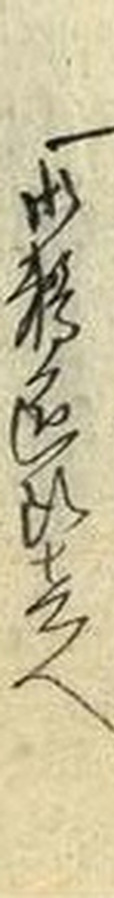御鵜匠頭壱人

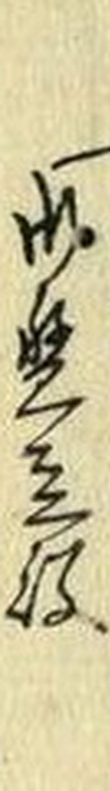御盤立役
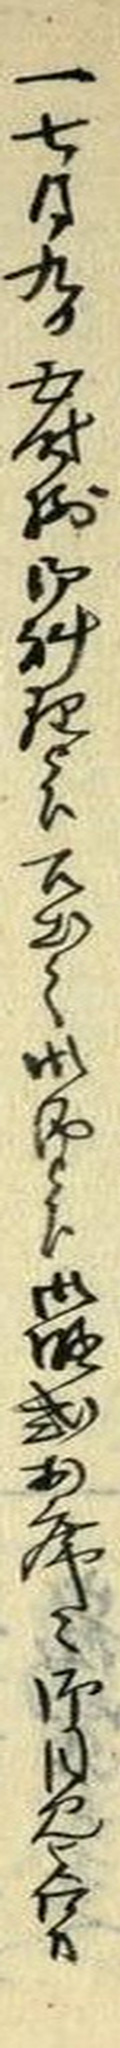一七月九日五時揃御料理被下召出之御酒被下御略式於席々御目見被仰付
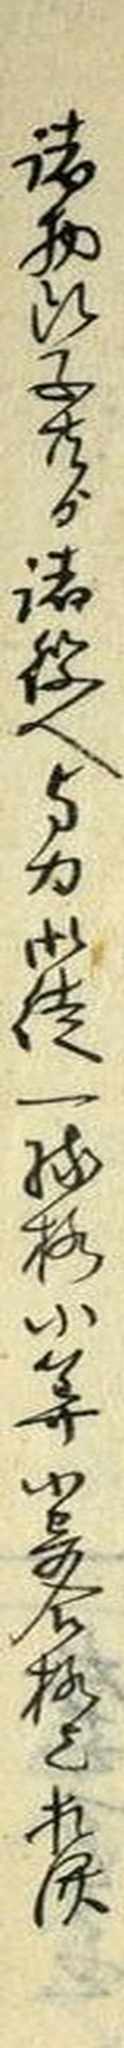諸物頭子共ゟ諸役人与力御徒一統格小算小寄合格迄相済
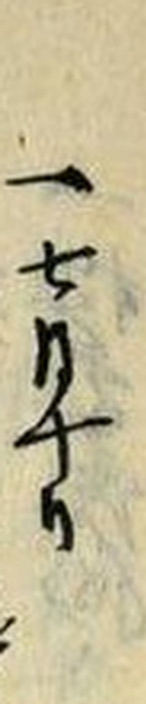一七月十日
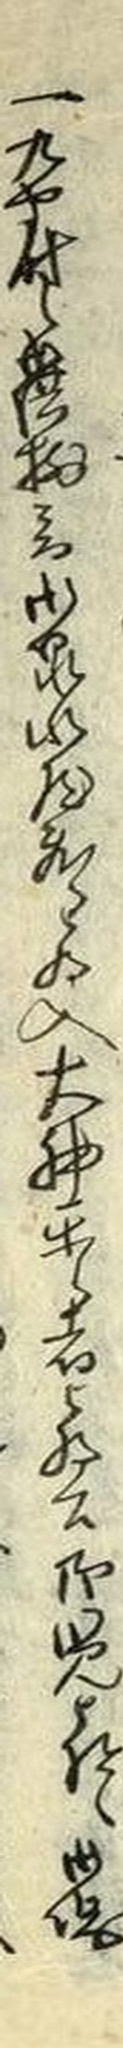一九半時之御供揃ニ而御泉水屋敷へ被為入大神楽之者被為召御覧被遊候御側
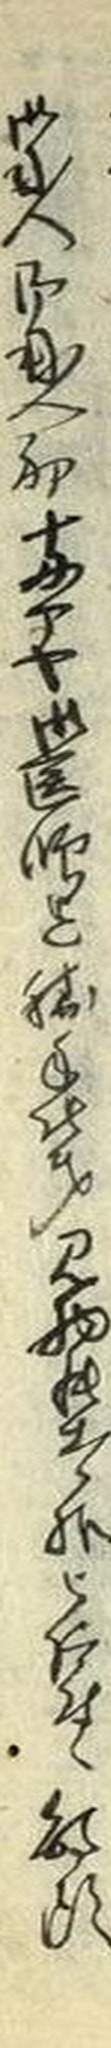御用人御用人初両部や御医師迄勝手次第見物罷出候様被仰付候待頭
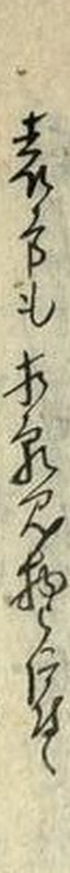表方も相願見物被仰付候
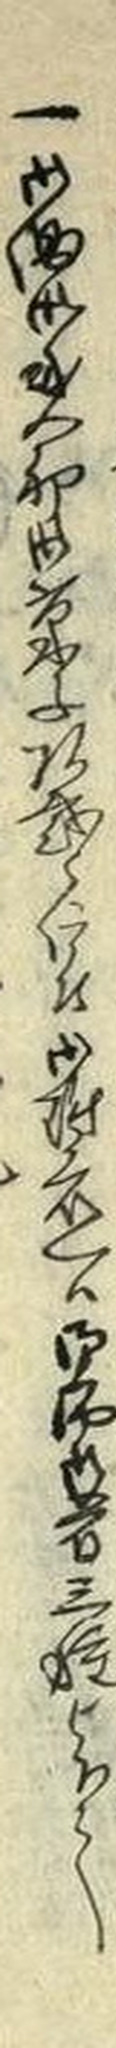一御側御用人初御菓子頂戴被仰付御附衆へハ御酒御肴三種被下之
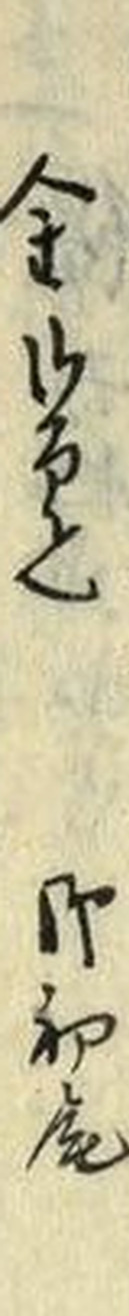金弐百疋御初尾
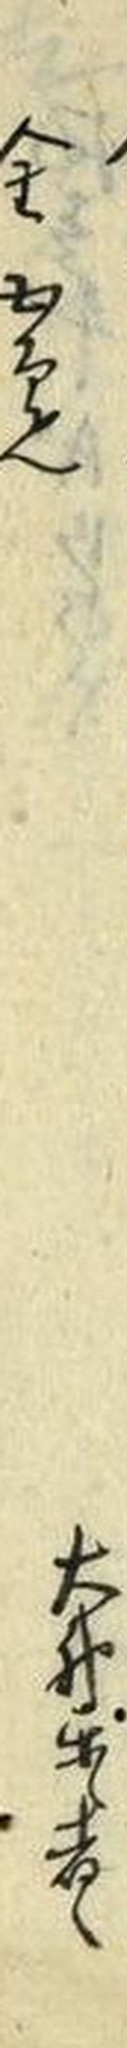金五百疋大神楽之者へ
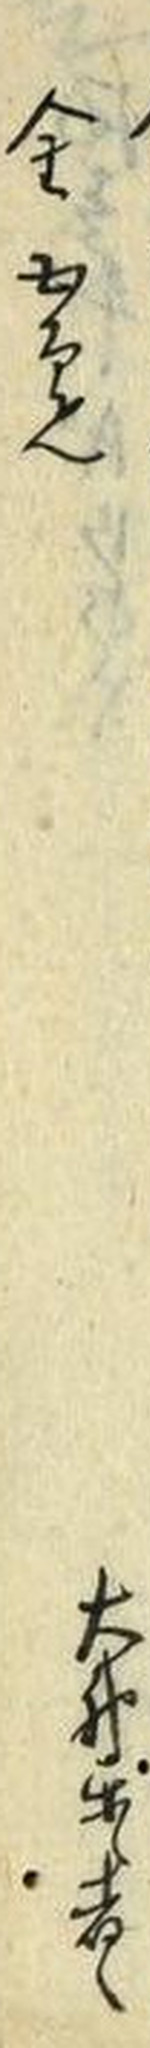金五百疋大神楽之者へ

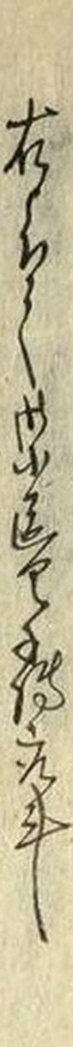右被下之御小道具手伝取斗
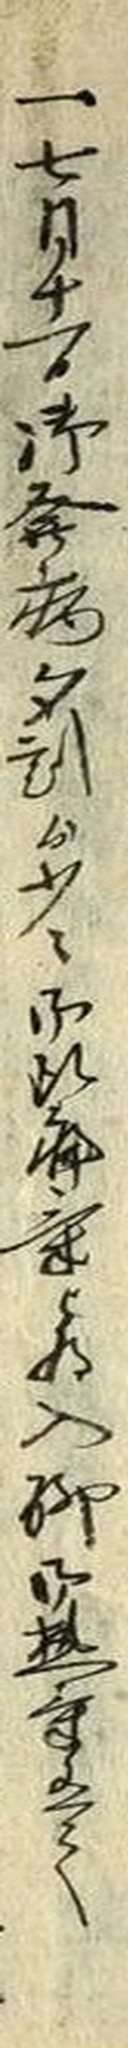一七月十一日御発病夕刻ゟ少々御頭痛気被為入聊御熱気有之
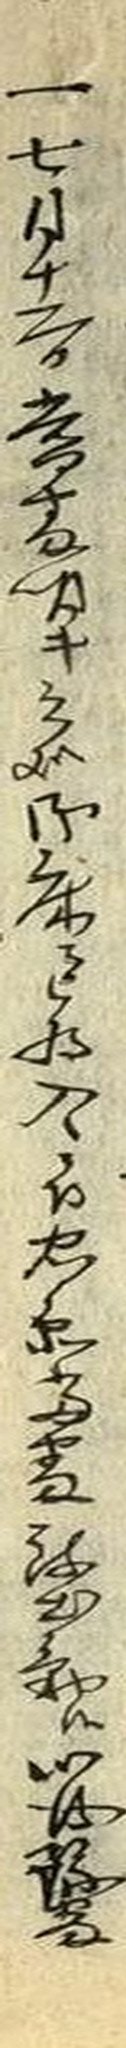一七月十二日当番明キ之処御床ニ被為入候ニ付忠兵衛当番致出勤候以後隔番
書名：少傅日録抄（斉善付側向頭取日記、江戸并道中、初入在国、逝去後…
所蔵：福井県文書館 Fukui Prefectural Archives
